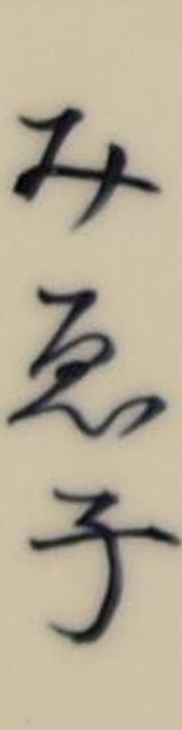みゑ子
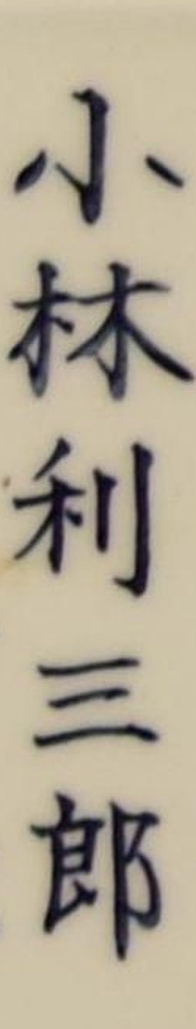小林利三郎
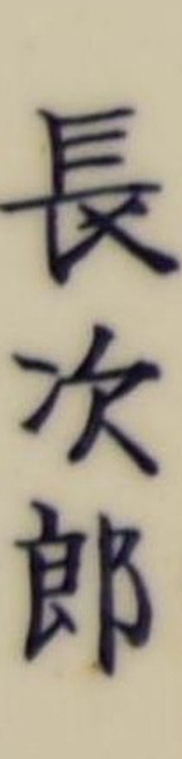長次郎

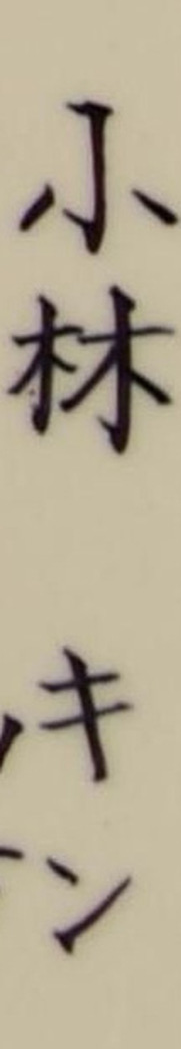小林キン
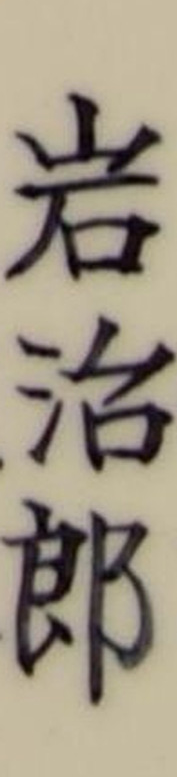岩治郎
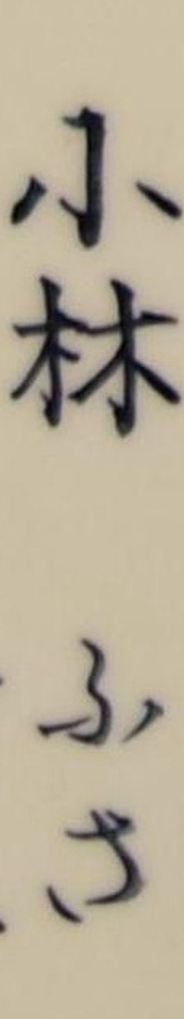小林ふさ
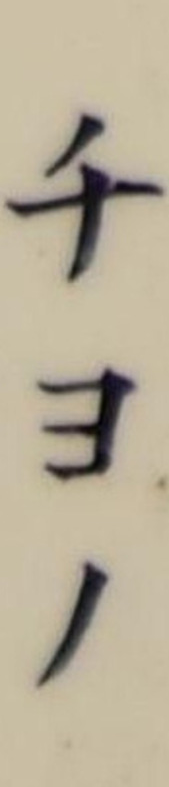チヨノ
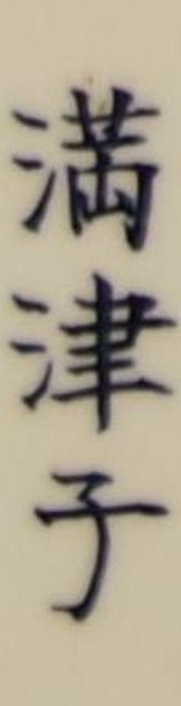満津子
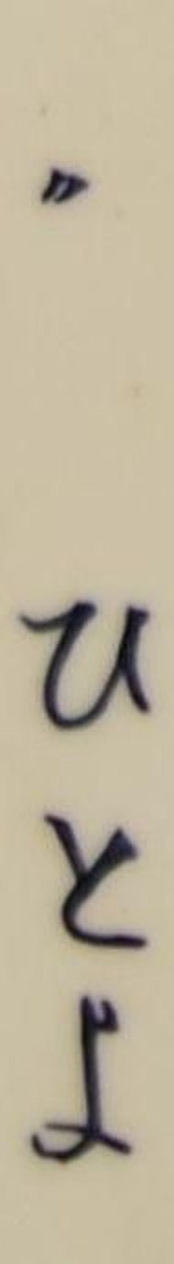ひとよ
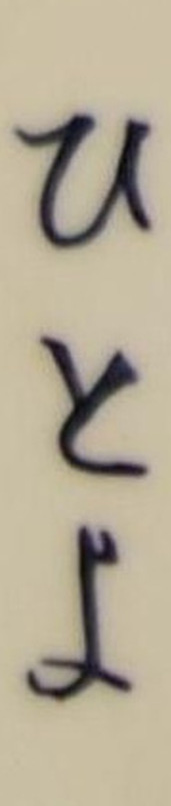ひとよ
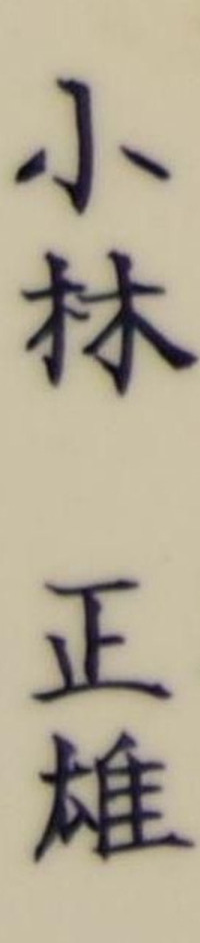小林正雄
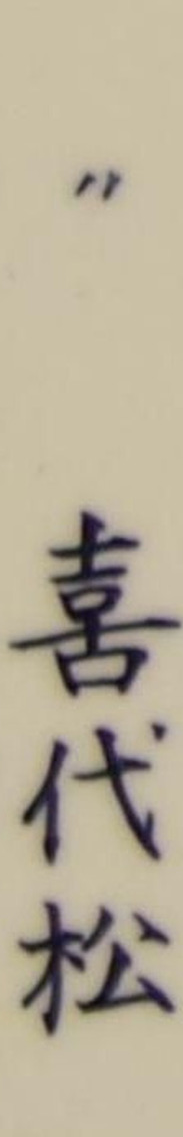喜代松
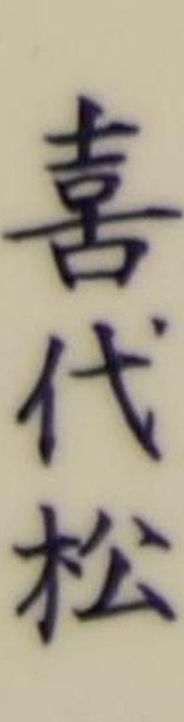喜代松

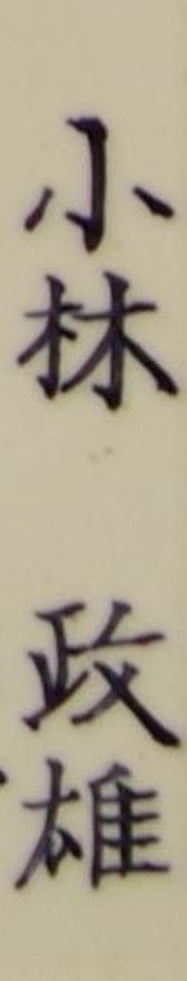小林政雄
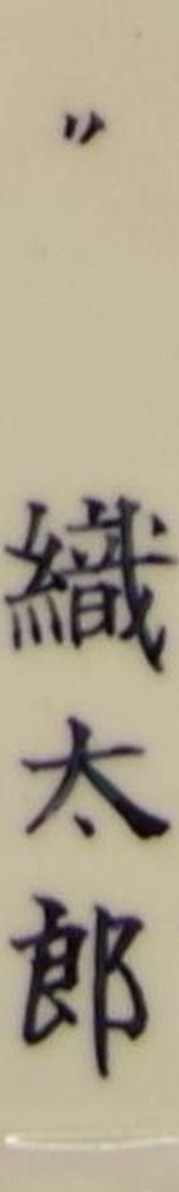織太郎
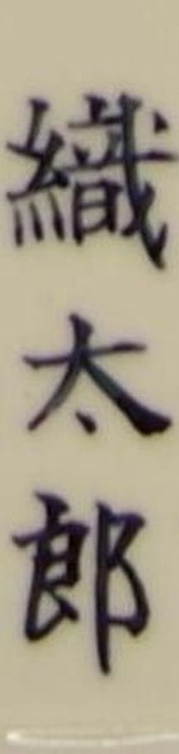織太郎
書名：A~D
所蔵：koyasan kongobuji
